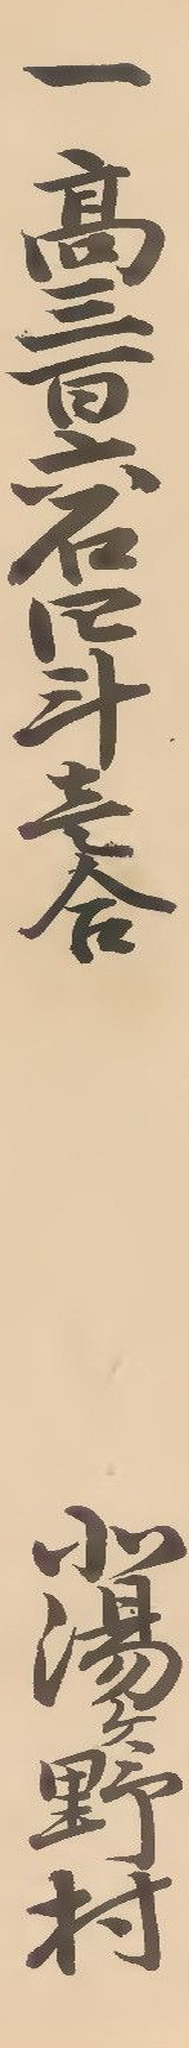一高三百六石四斗壱合北湯ヶ野村
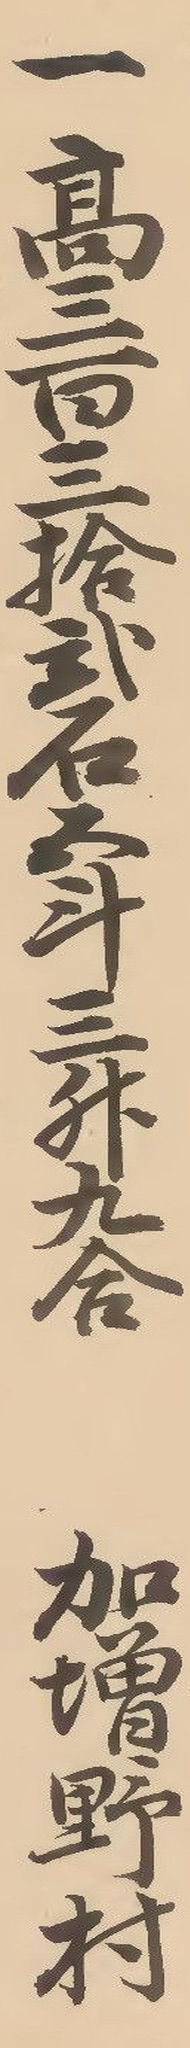一高三百三拾弐石五斗三升九合加増野村
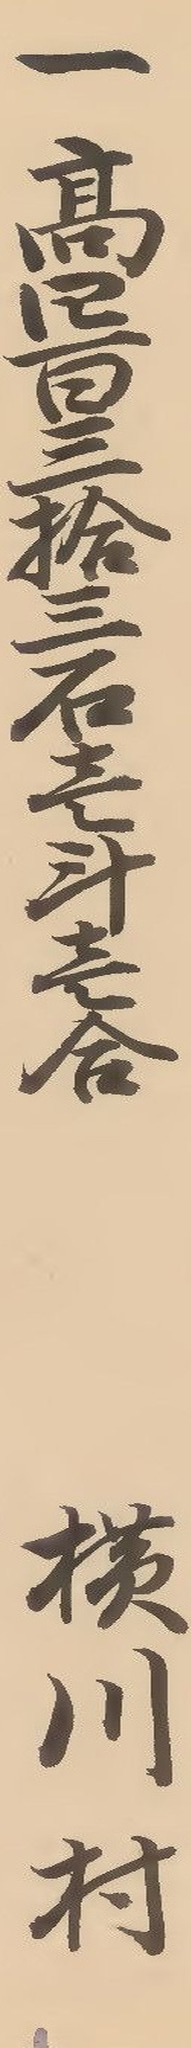一高四百三拾三石壱斗壱合横川村
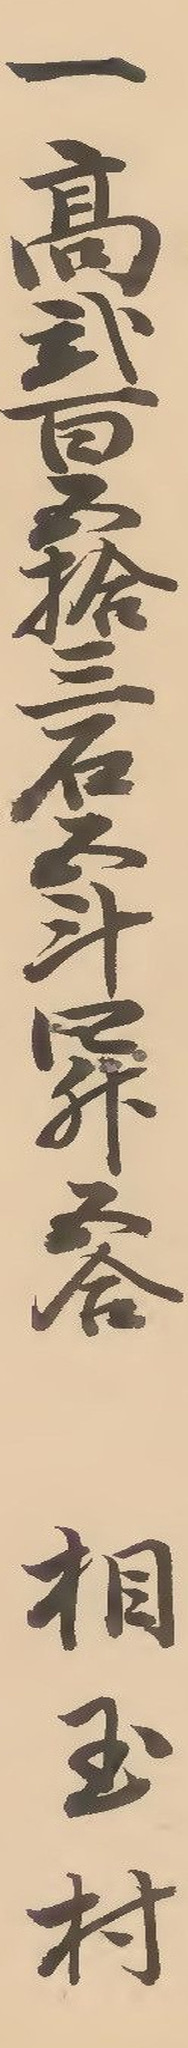一高弐百五拾三石五斗四升五合相玉村

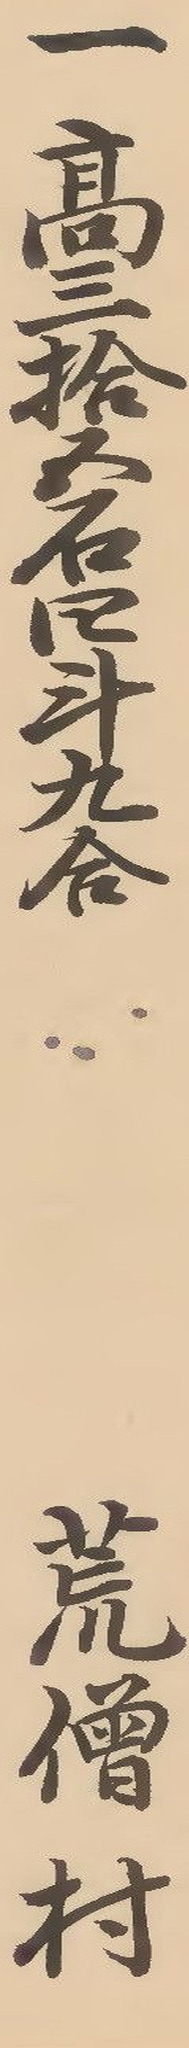一高三拾五石四斗九合荒僧村
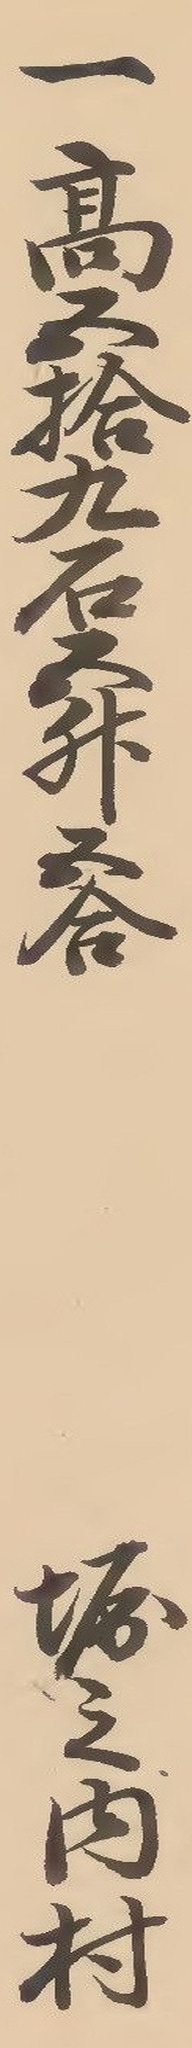一高五拾九石五升五合堀之内村
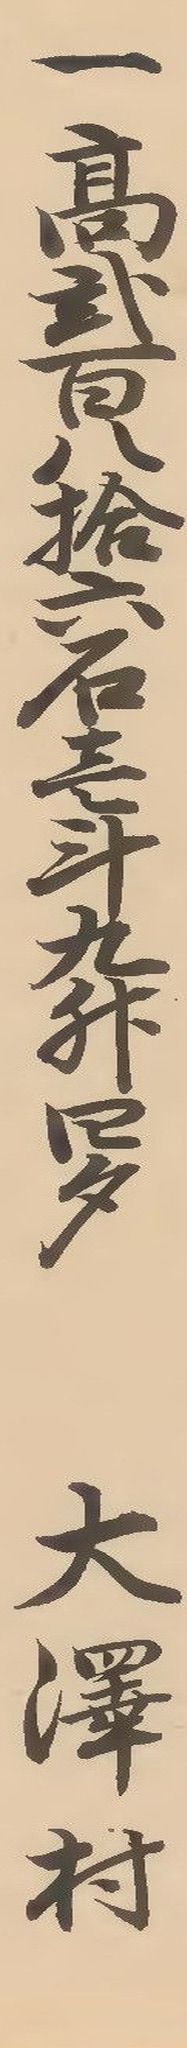一高弐百八拾六石壱斗九升四勺大沢村
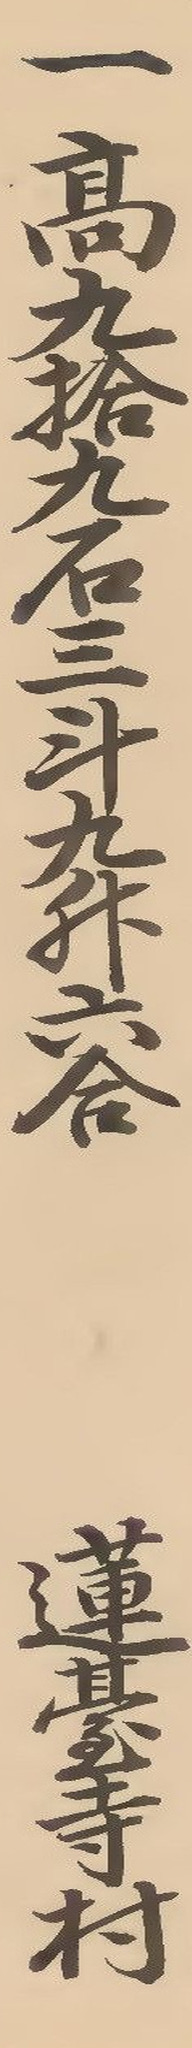一高九拾九石三斗九升六合蓮台寺村
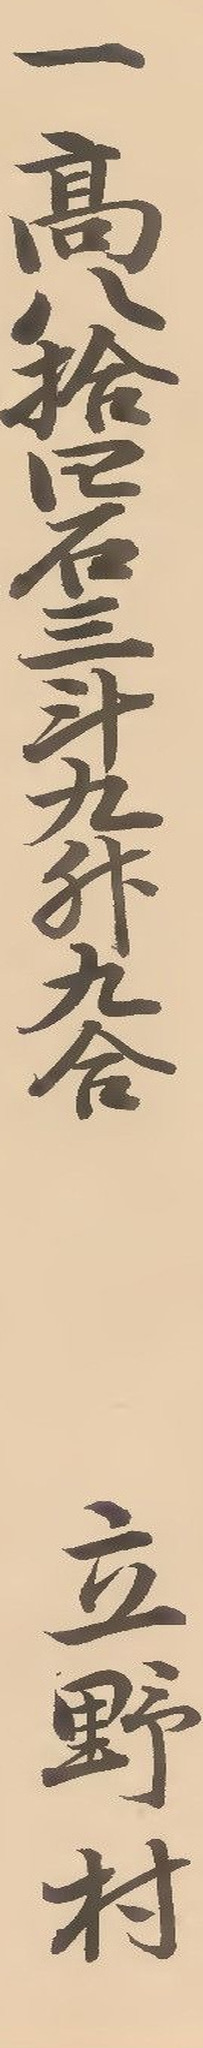一高八拾四石三斗九升九合立野村
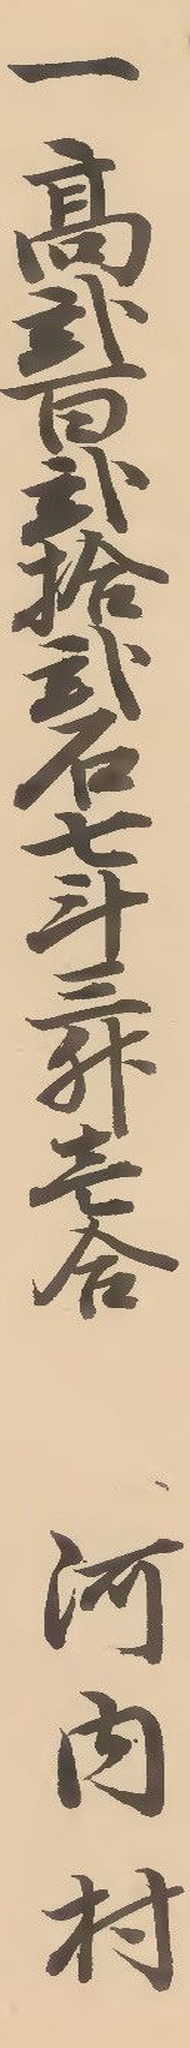一高弐百弐拾弐石七斗三升壱合河内村
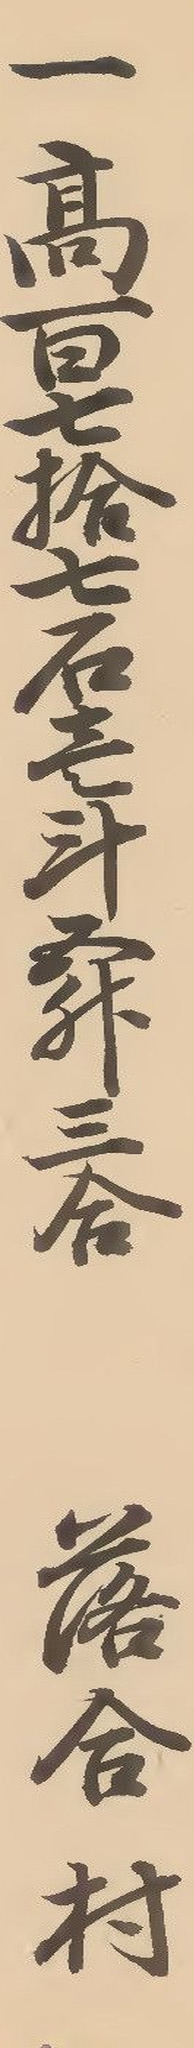一高百七拾七石壱斗五升三合落合村
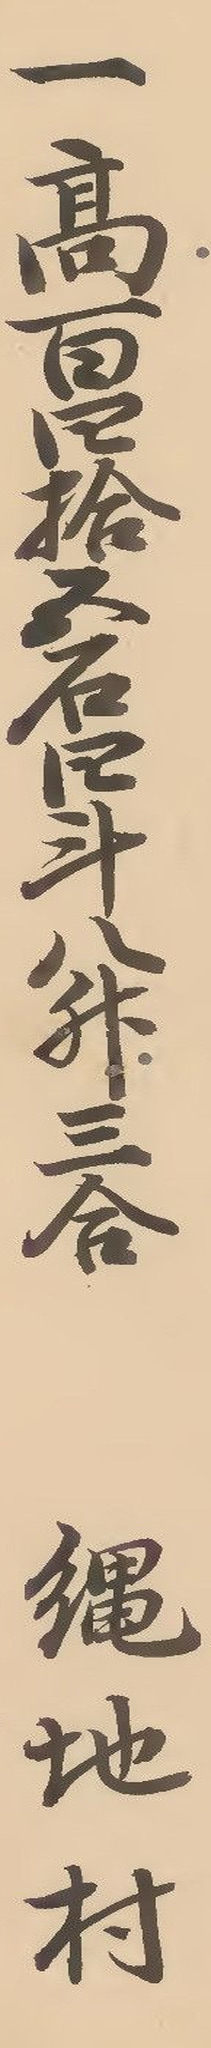一高百四拾五石四斗八升三合縄地村

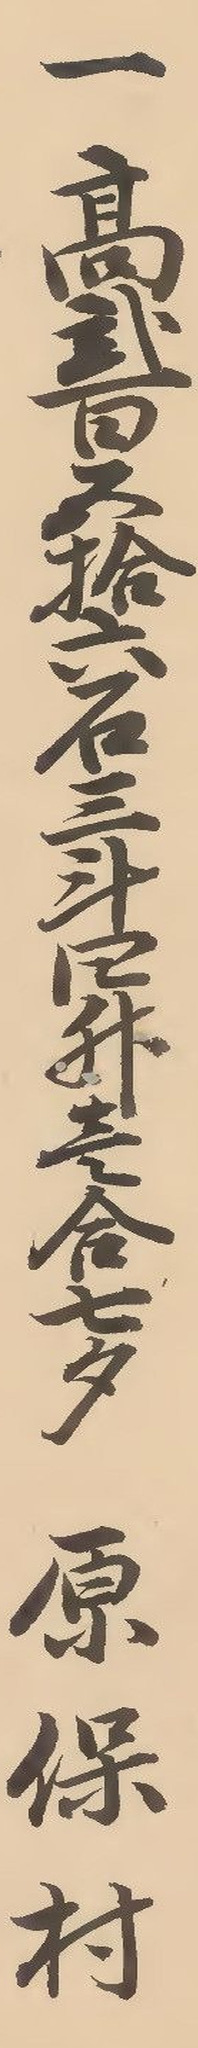一高弐百五拾六石三斗四升壱合七勺原保村
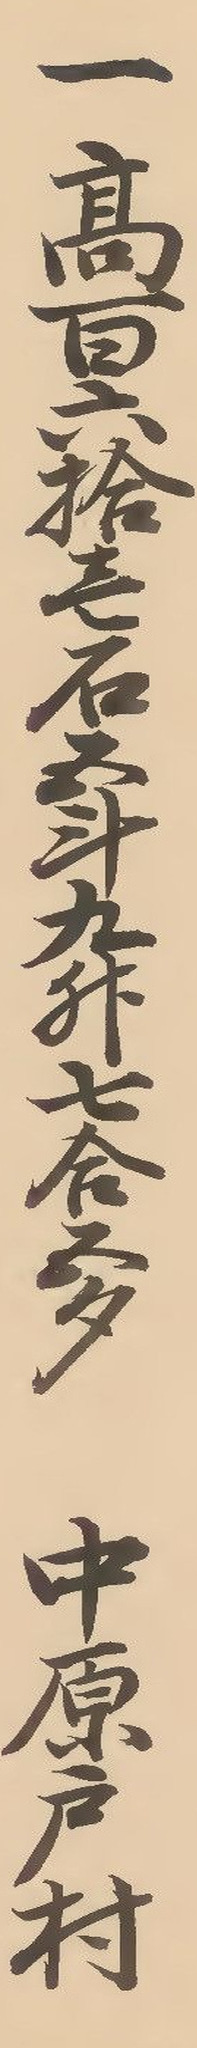一高百六拾壱石五斗九升七合五勺中原戸村
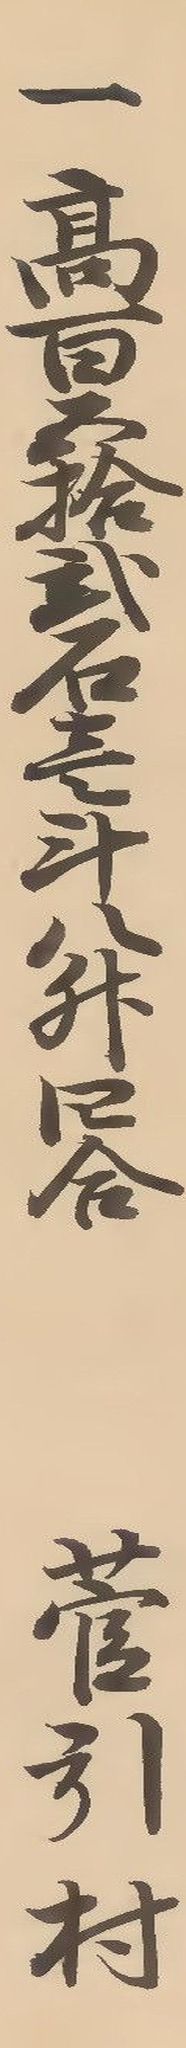一高百五拾弐石壱斗八升四合菅引村
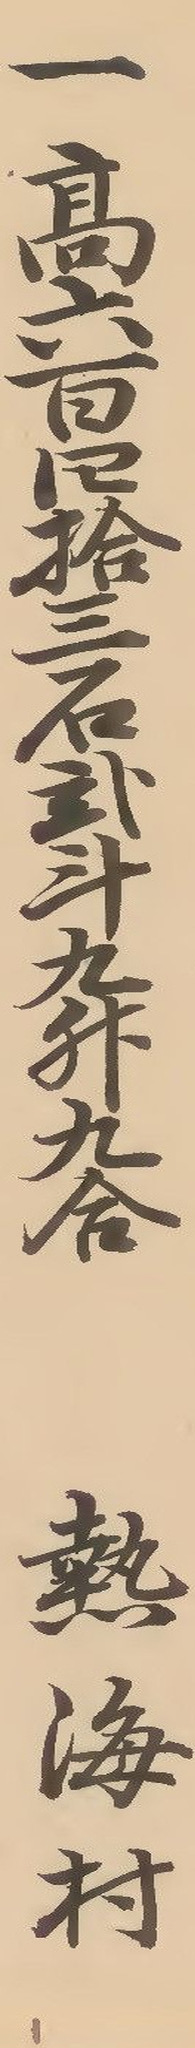一高六百四拾三石弐斗九升九合熱海村
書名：伊豆国郷帳
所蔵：国立公文書館 National Archives of Japan
